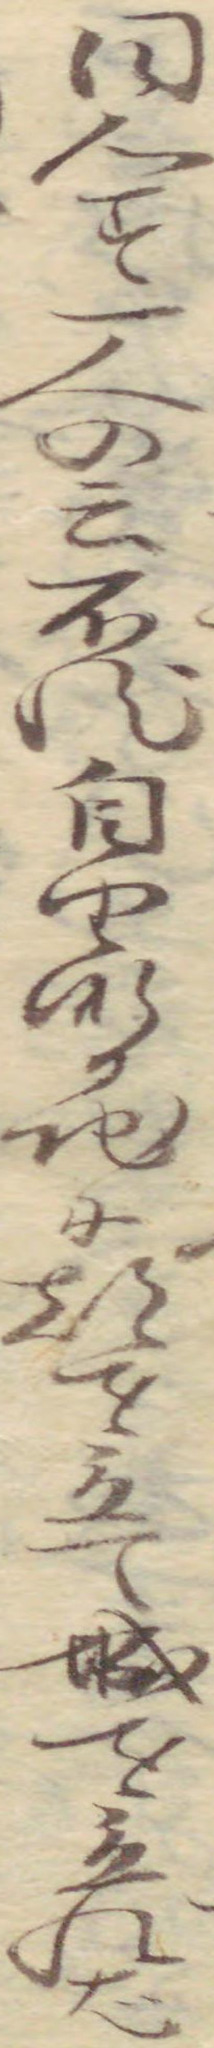同心す一人の云不然自由なる地に都を立て城を立れば
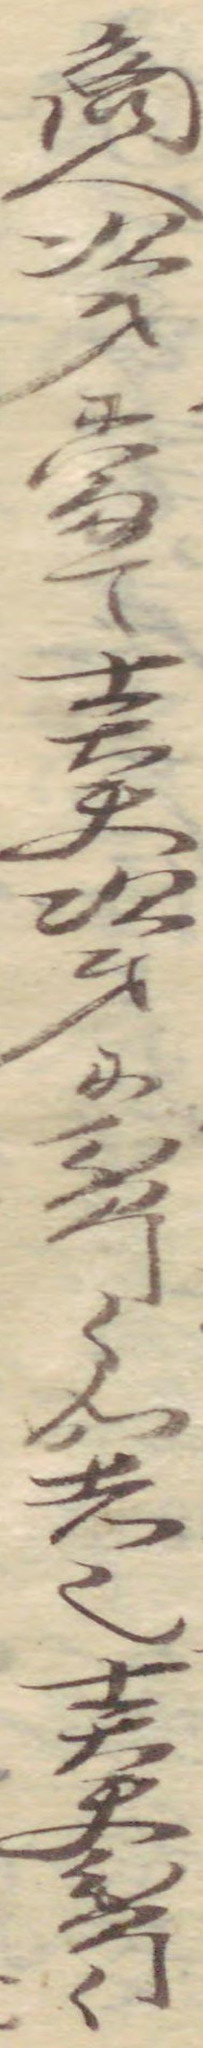商人次第に富て士大夫次第に貧しく成者也士大夫貧しく
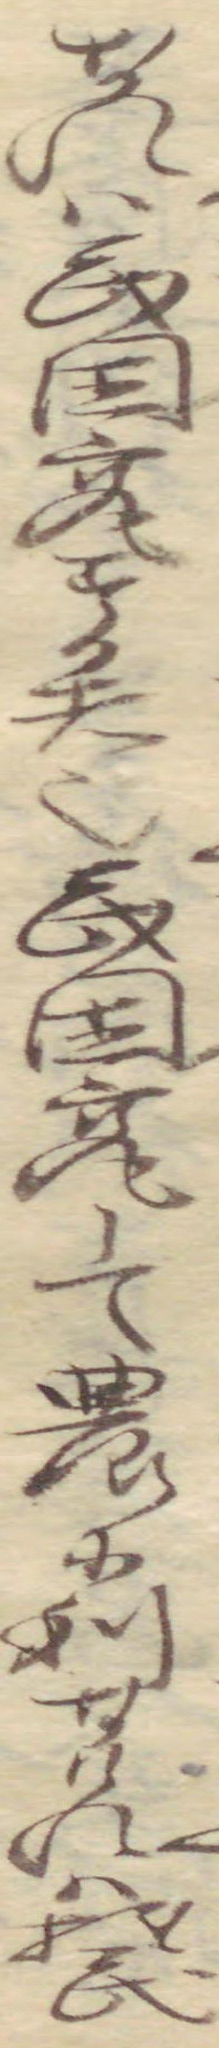なれは民国窮する者也民国窮して農に利なけれは遊民
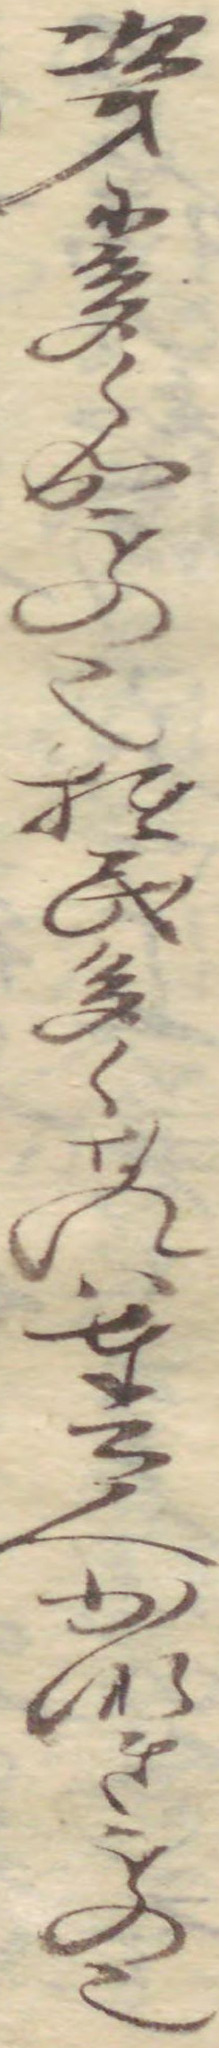次第に多く成もの也遊民多くなれは奉公人少なきもの也
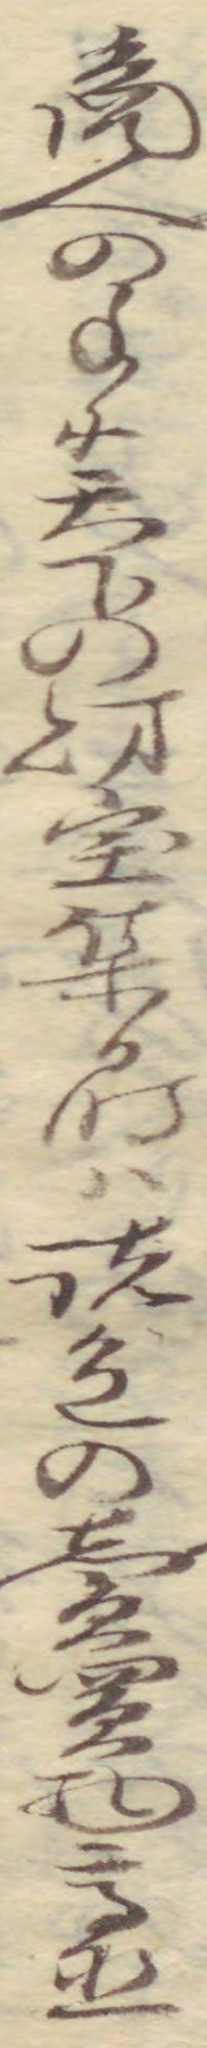商人の手に天下の財宝集る時は諸色の売買物高直
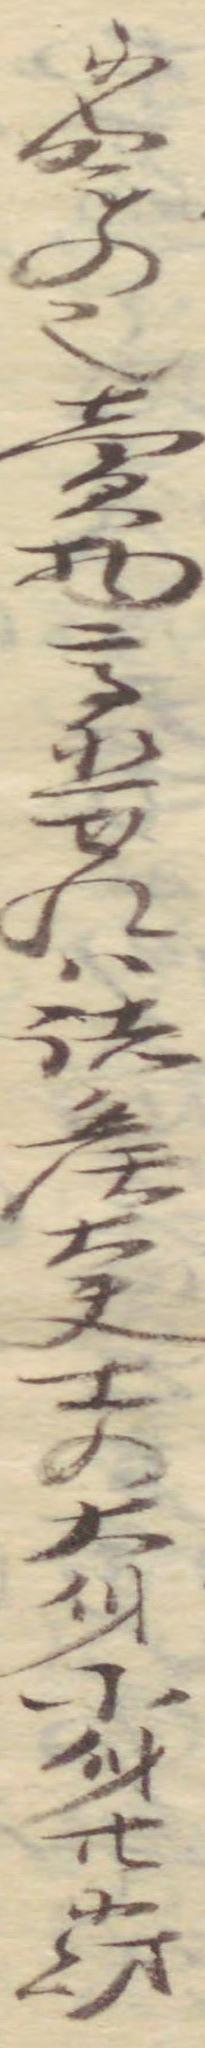に成もの也売物高直なれは諸侯大夫士の大身小身共に財
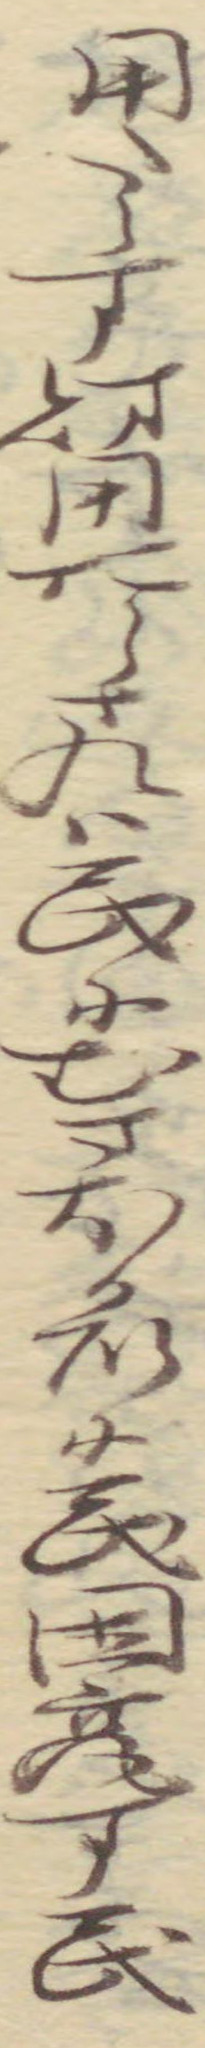用たらす財用たらされは民にむさほる故に民国窮す民
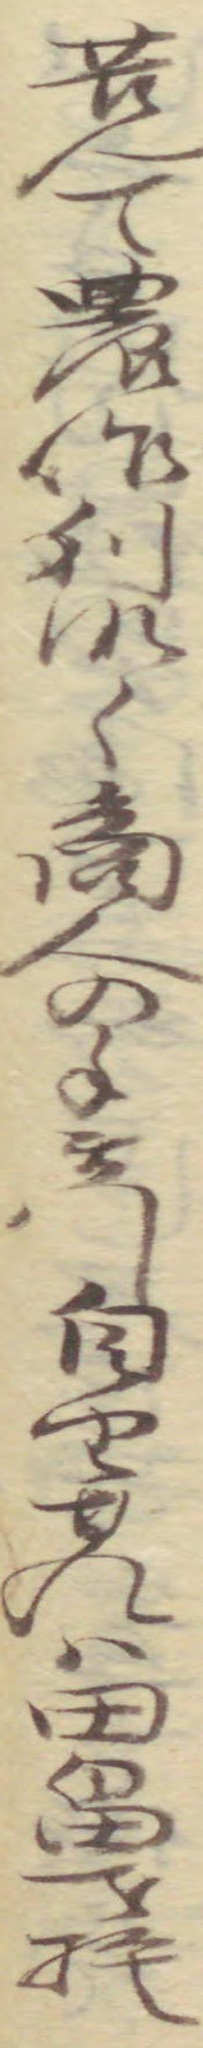苦んて農作利なく商人の手まわし自由なれは田畠を捨
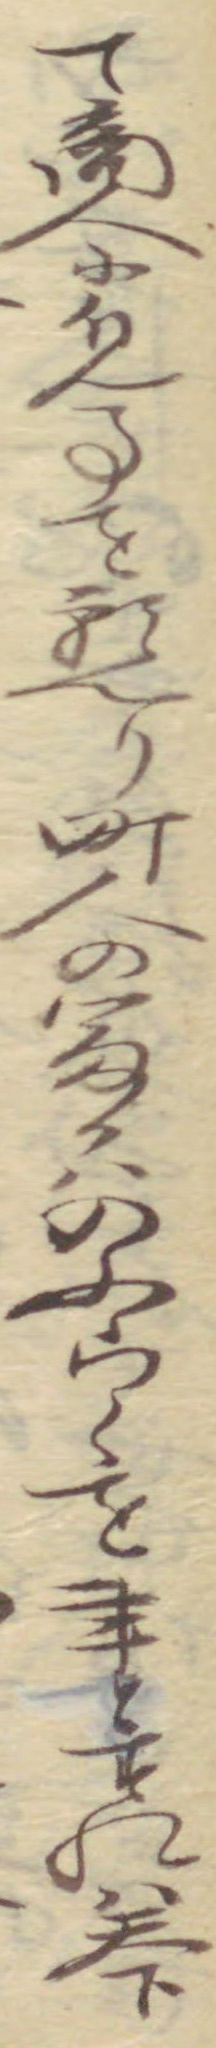て商人に付ん事を願へり町人の富るはのふらくを事とすれは天下
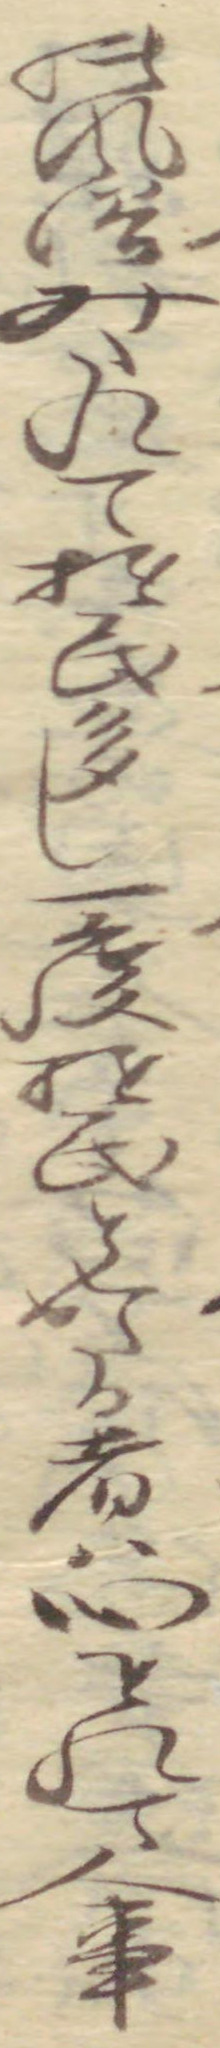の風俗みたれて遊民多し一度遊民と成たる者は心それて人事
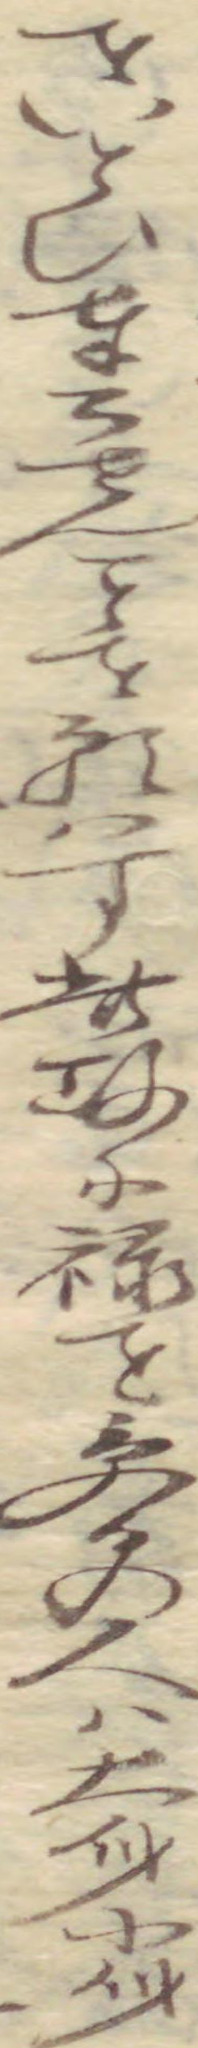をいとひ奉公せんことを願はす此故に禄を受る人は大身小身
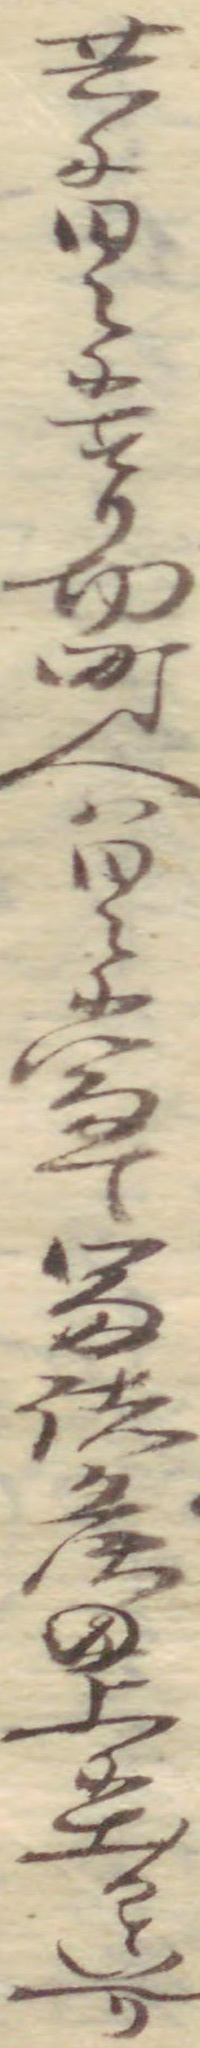共に日〻にすり切町人は日〻に富て富諸侯の上に出るといへり
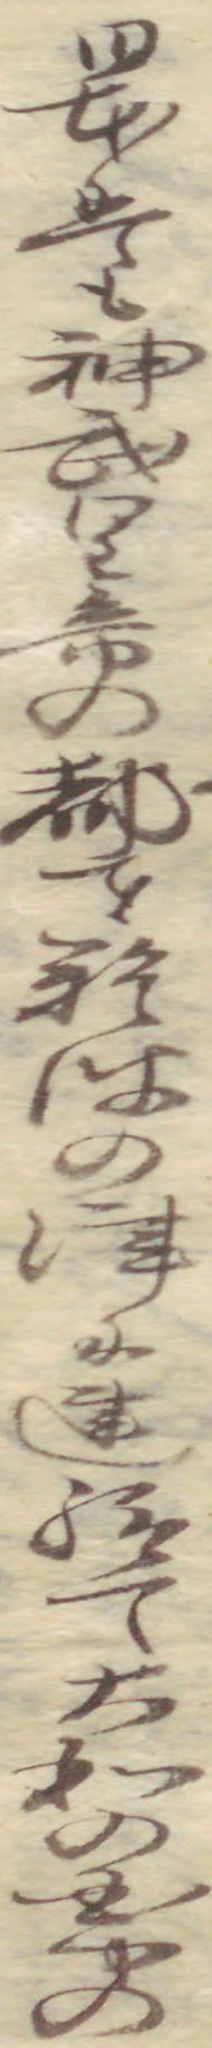日本にても神武皇帝の都を難波の津に建給て大和の国中の
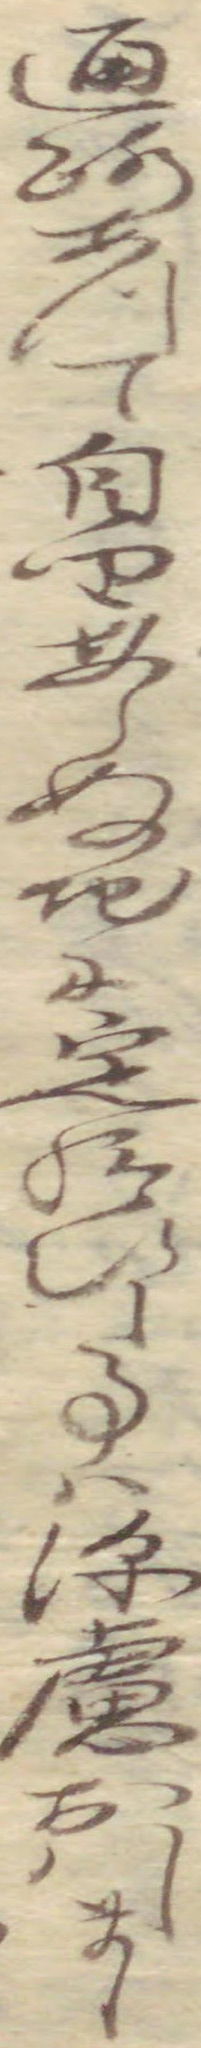通路あつて自由ならぬ地に定給ひし事は深慮おはしまし
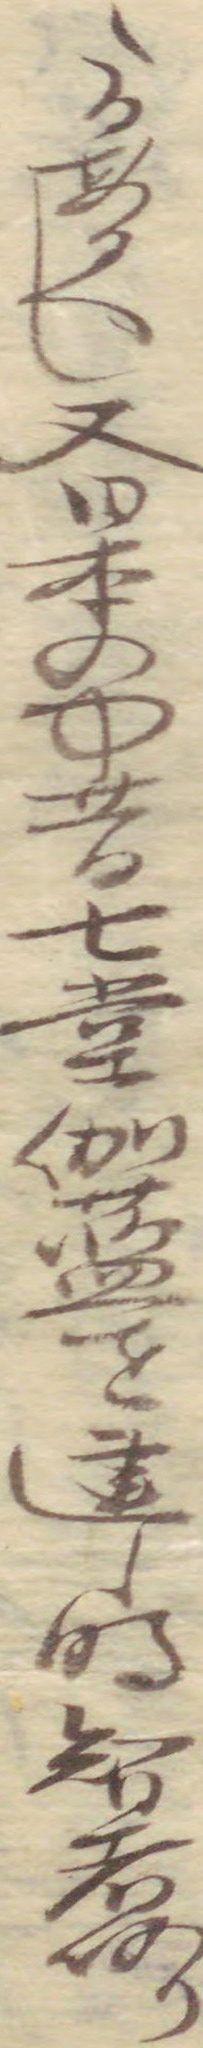たるなるへし又日本の中昔七堂伽藍を建し時智者あり
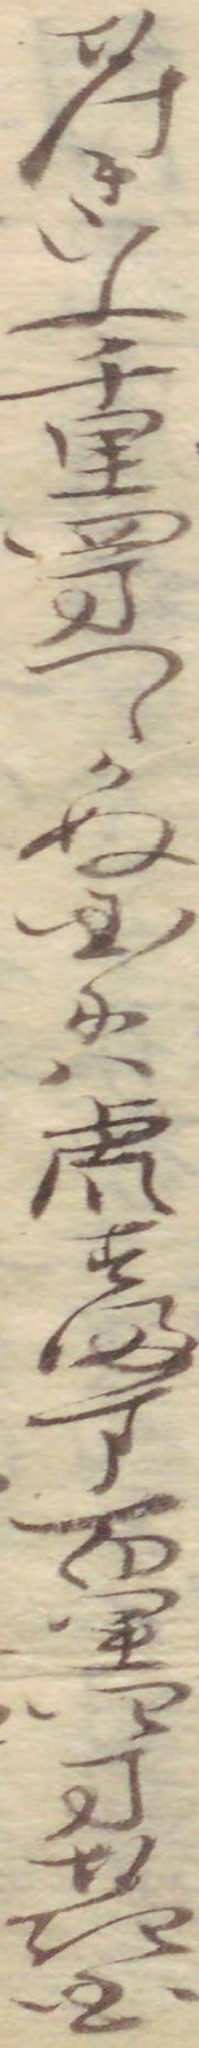なけきいふ千里四方つゝかぬ国には虎すます百里四方なき国
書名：鶯宿雑記. 巻263-264
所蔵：国立国会図書館 National Diet Library, JAPAN
